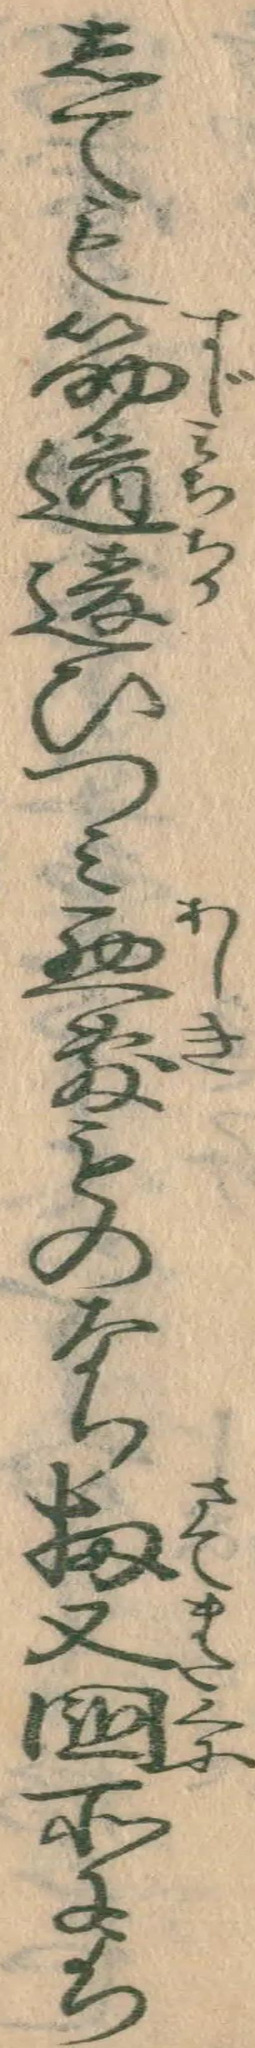しても筋道違ひつみ悪敷ものなり扨又国所により
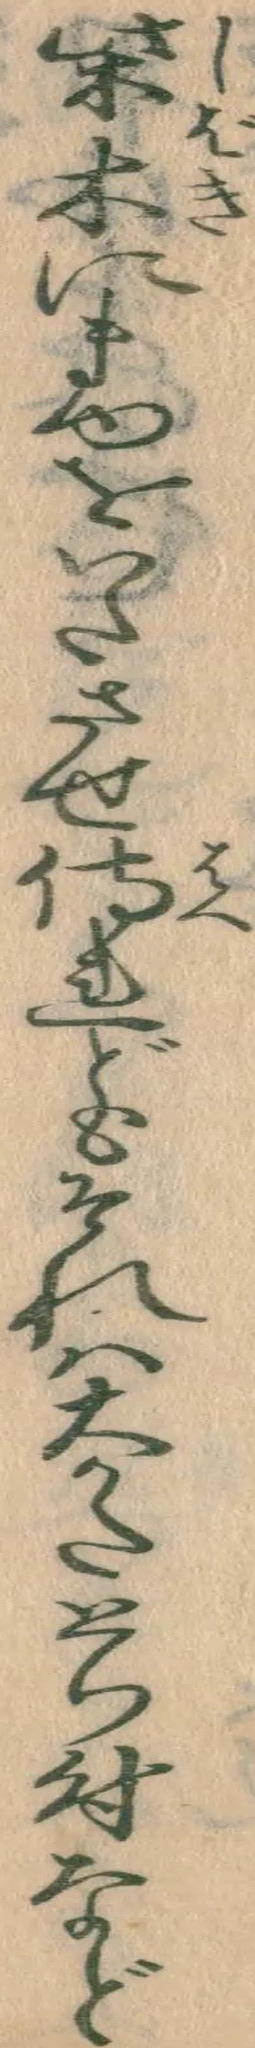柴木にまゆをいたさせ侍れどもそれは大かたとり付など
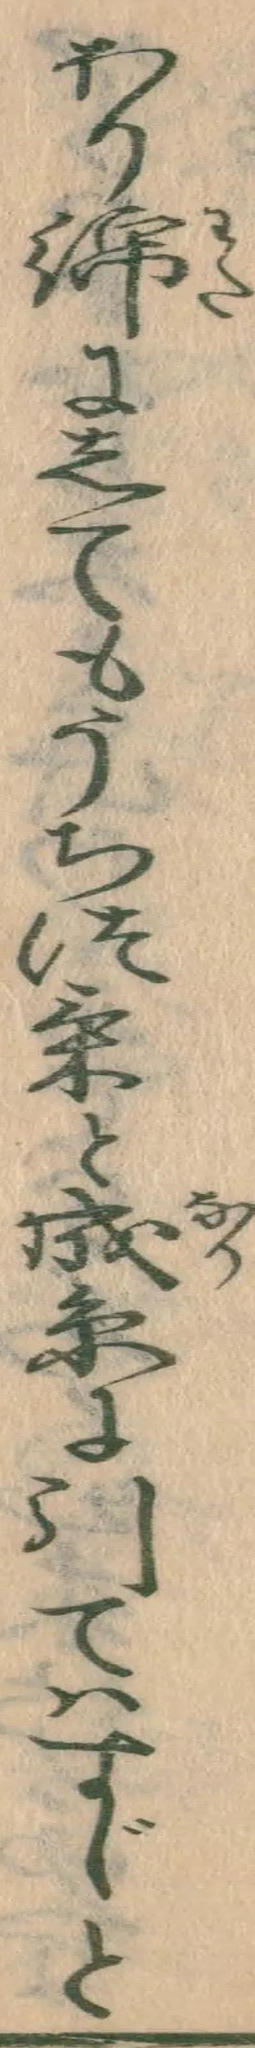あり綿にしてもうちつけと成糸に引てはすじと
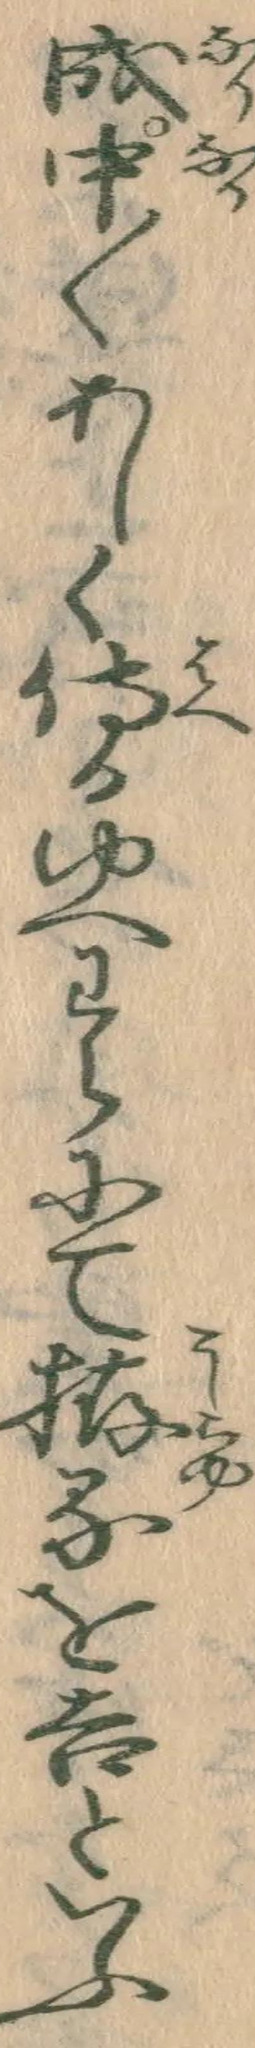成。中〳〵あしく侍るゆへわらにて拵るを吉といふ
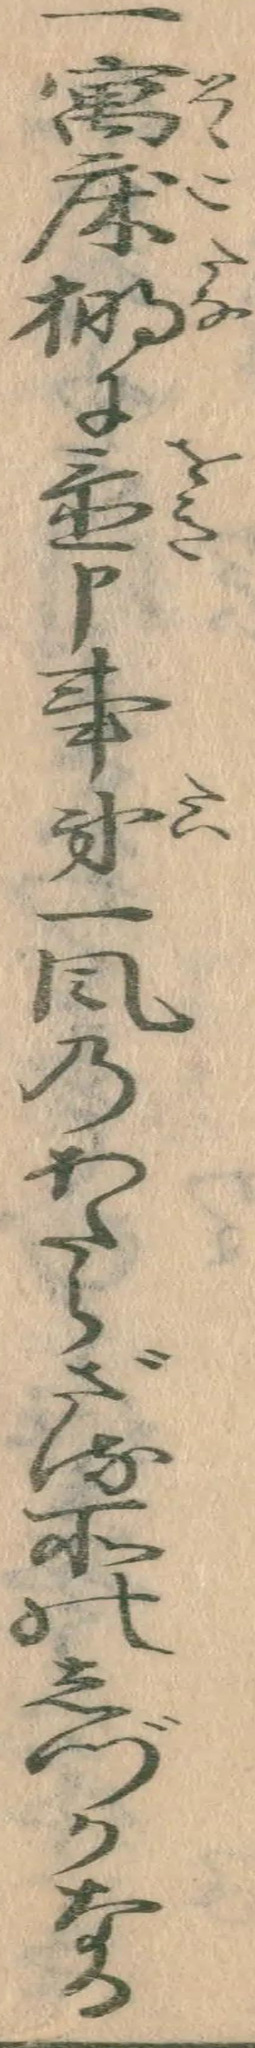一寓床棚に置申事第一風のあたらざる所のしづかなる
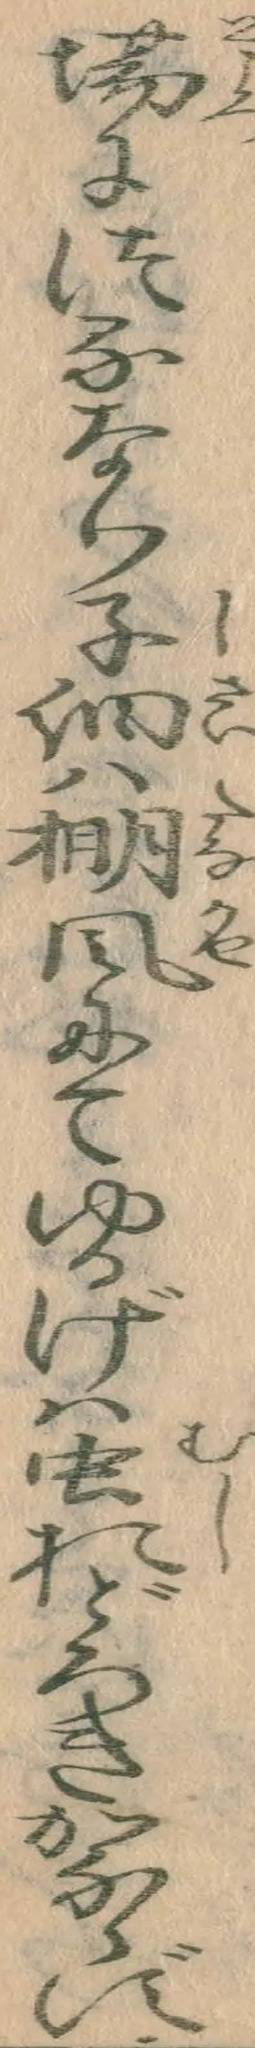場につるなり子細は棚風にてゆるげは虫おどろきかならず
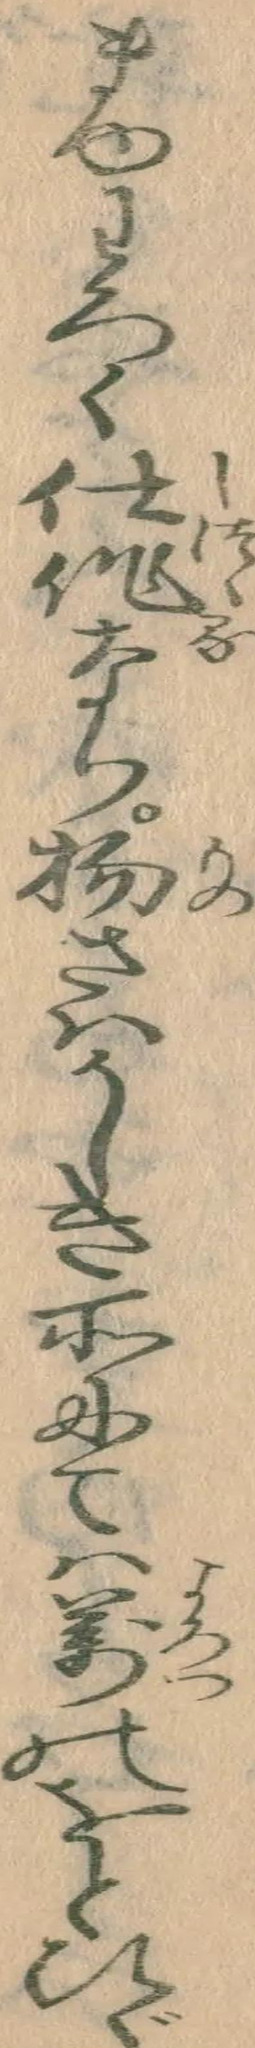まゆわろく仕作なり。物さはかしき所にては万のをとひゞ
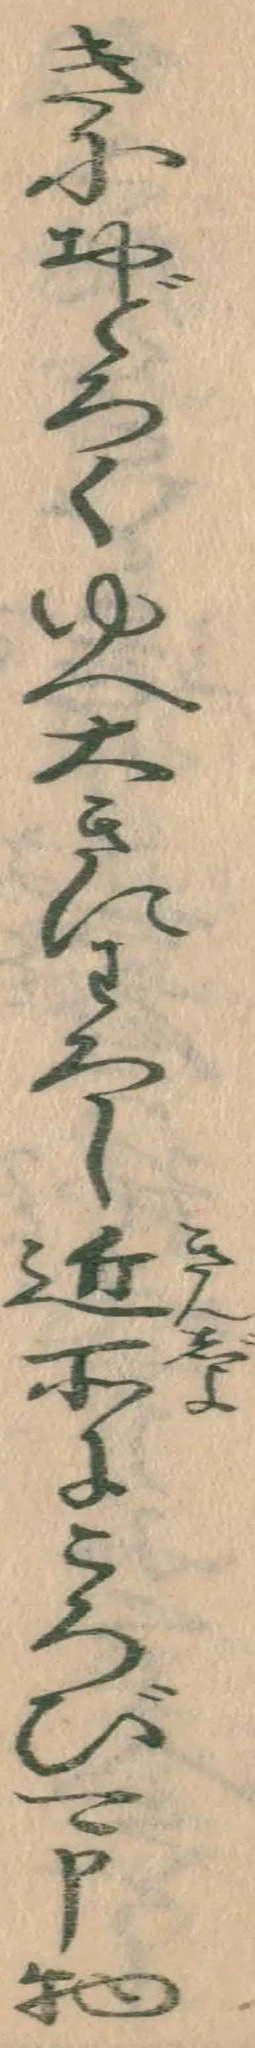きにおどろくゆへ大きにわろし近所にころび可申物
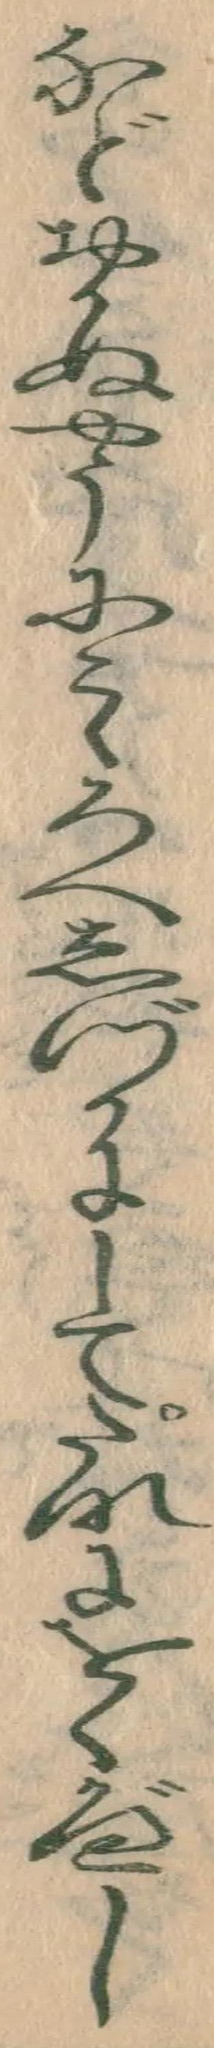などおかぬやうにこゝろへしづかにして。たなにをくべし
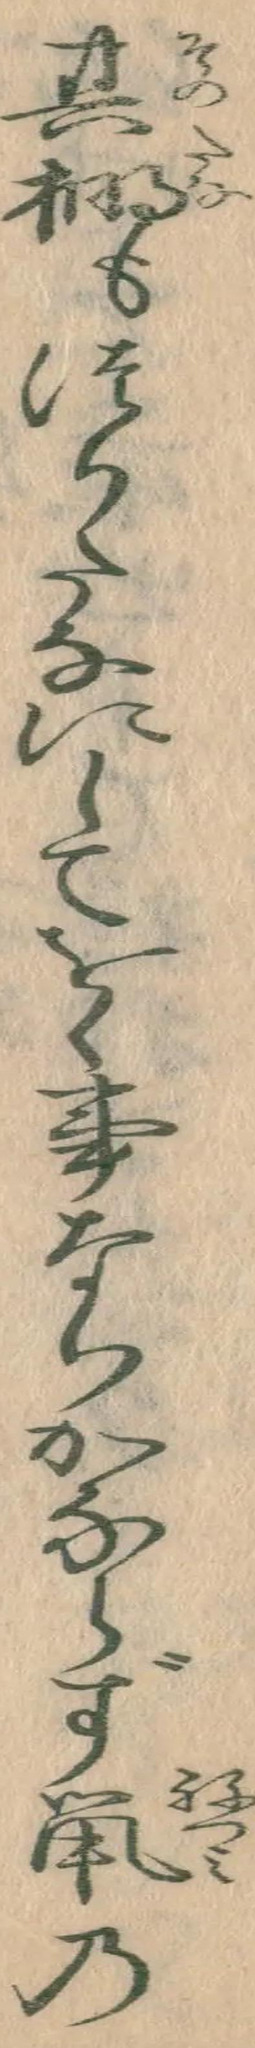其棚もつりたなにしてをく事なりかならず鼠の
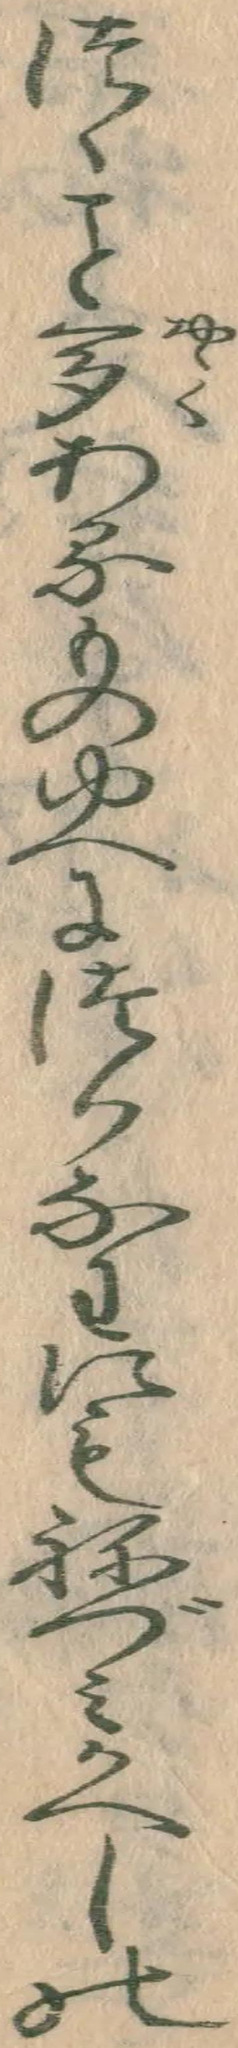つくこと多あるものゆへにつりなわにもねづみかへしの
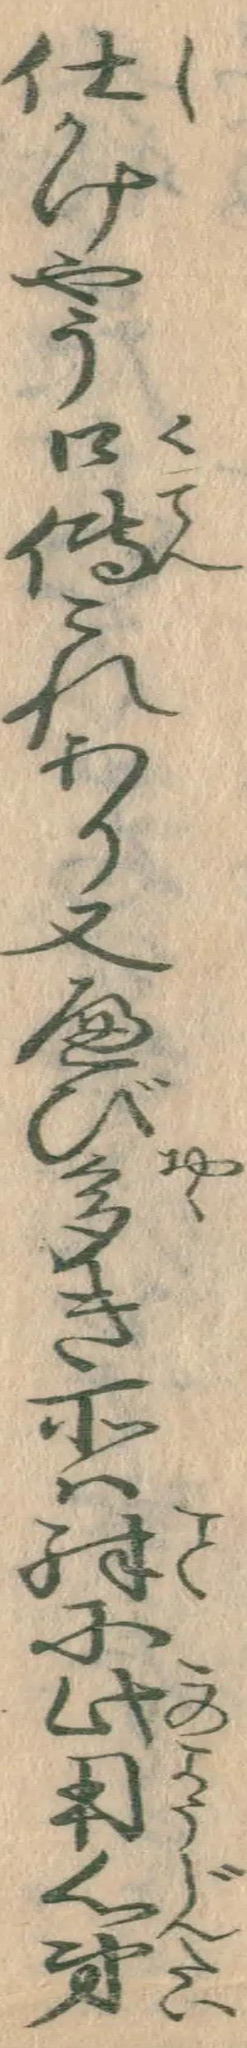仕かけやう口伝これあり又へび多き所は殊に此用心第
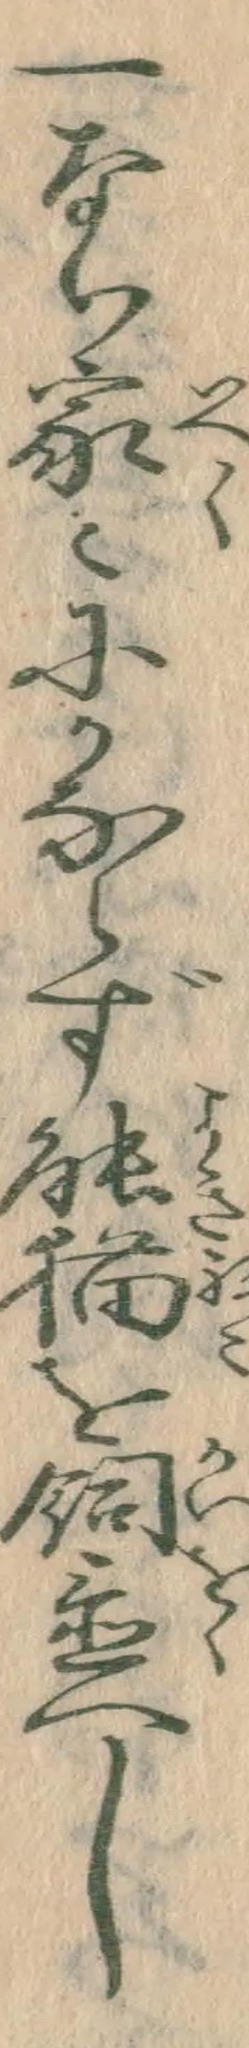一なり家々にかならず能猫を飼置へし
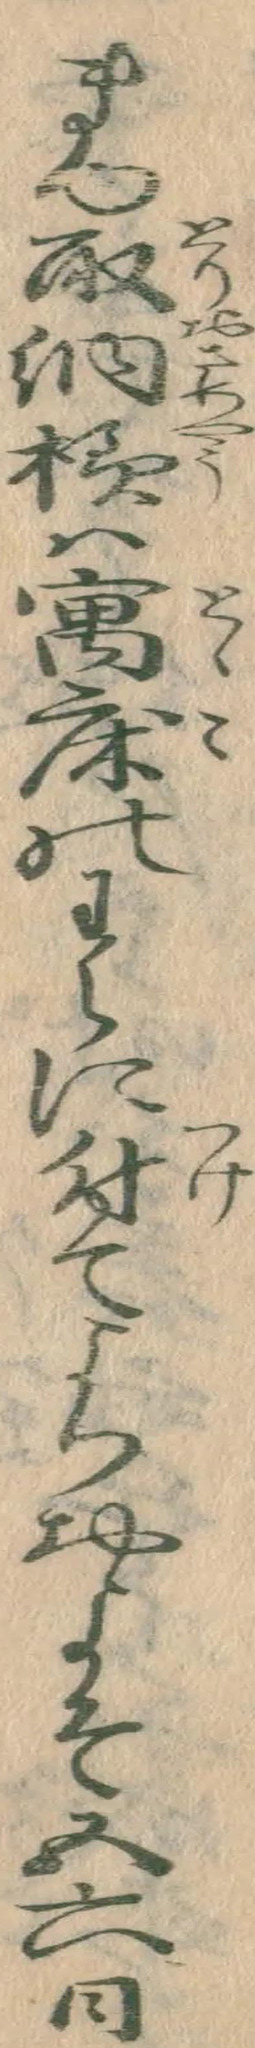一まゆ取納様は寓床のわらに付てよりおよそ五六日
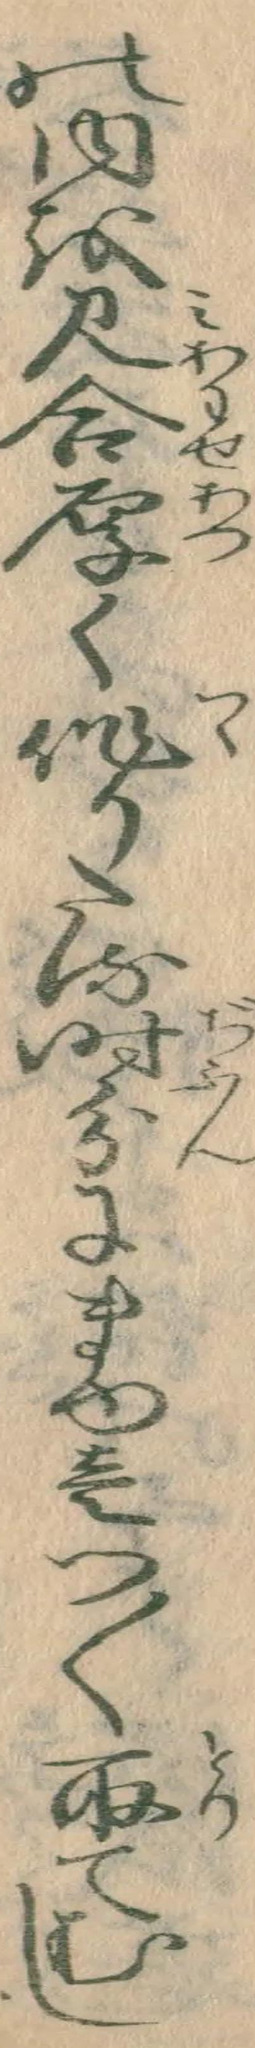の内を見合厚く作りたる時分にまゆ壱つ〳〵取てむし
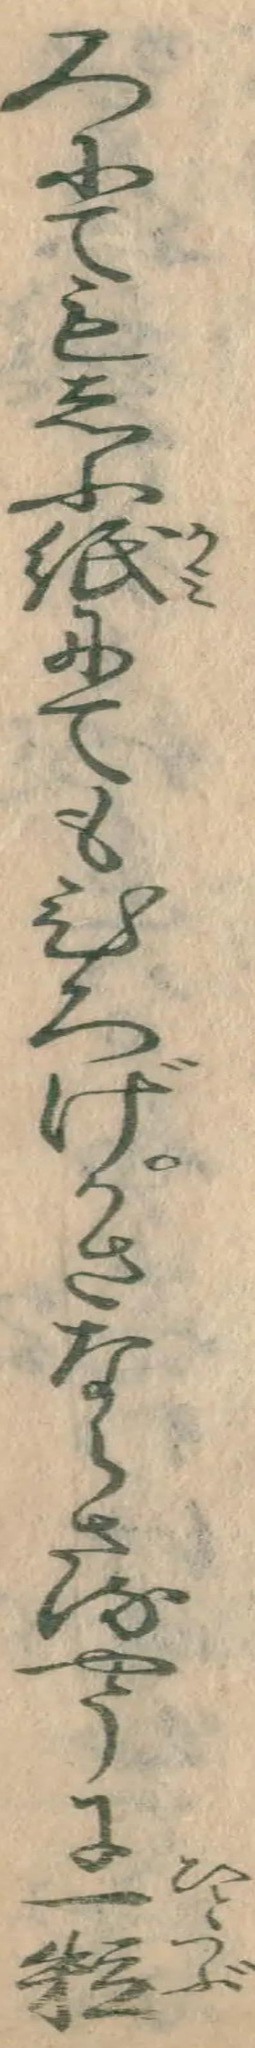ろにてもしふ紙にてもひろげ。かさならさるやうに一粒
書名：蚕飼養法記
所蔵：国立国会図書館 National Diet Library, JAPAN
